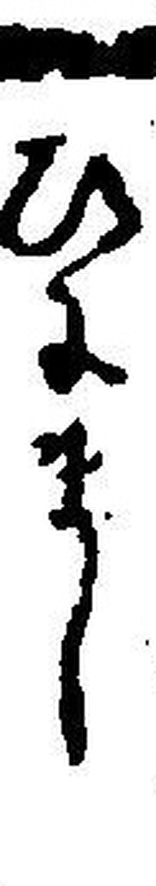ひにまし
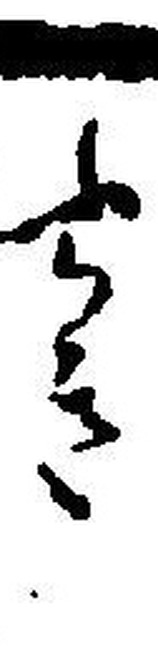ふかき
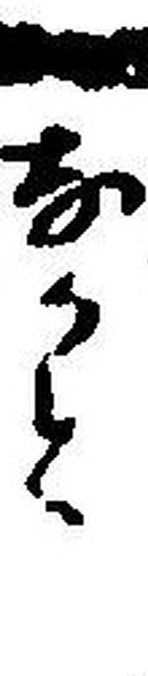なかと
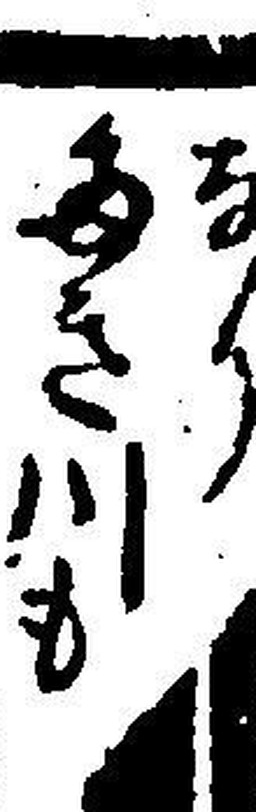たき川も
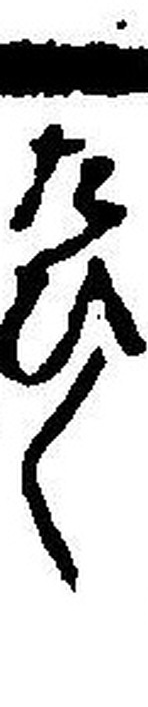たひ〳〵
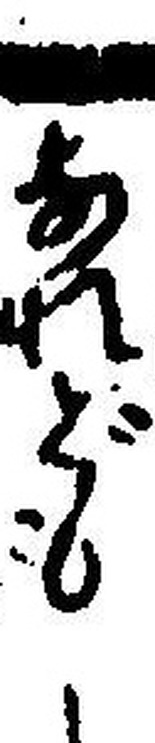なれども
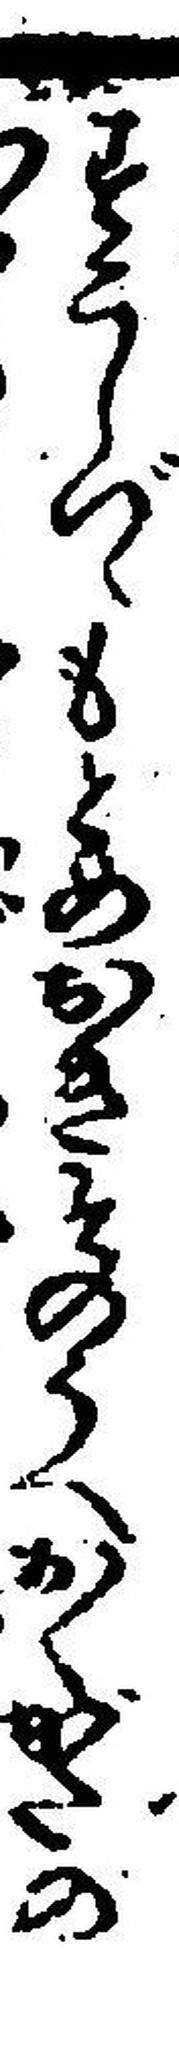すこしづゝもとめおきそのうへおくがたの
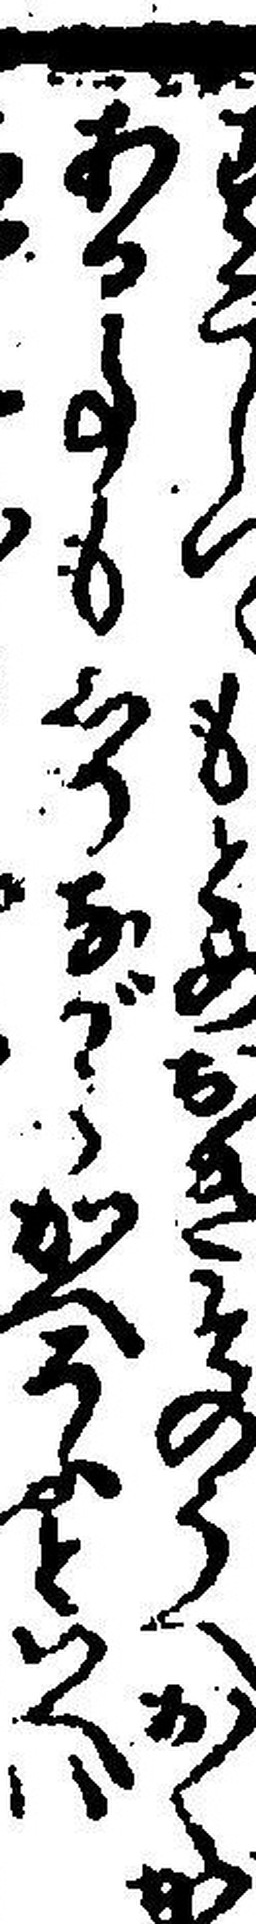ある事もしりながらかへろふといへは
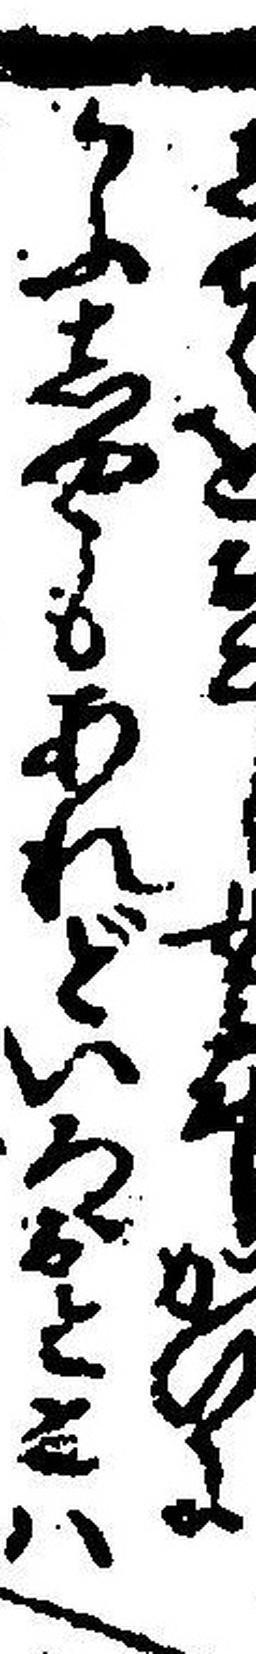かふしやもあれどいろおとこは
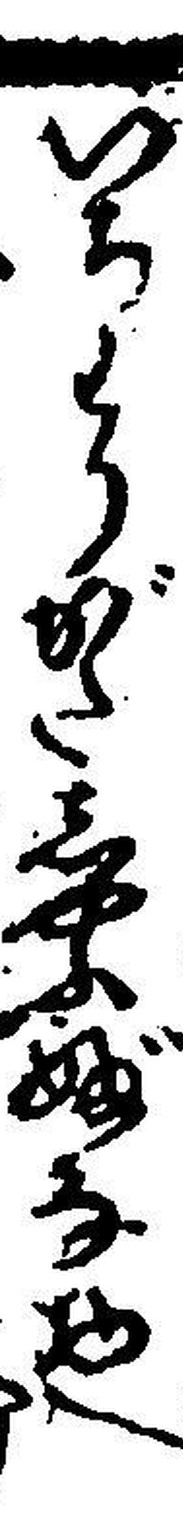いちわりがたしやふぶな物
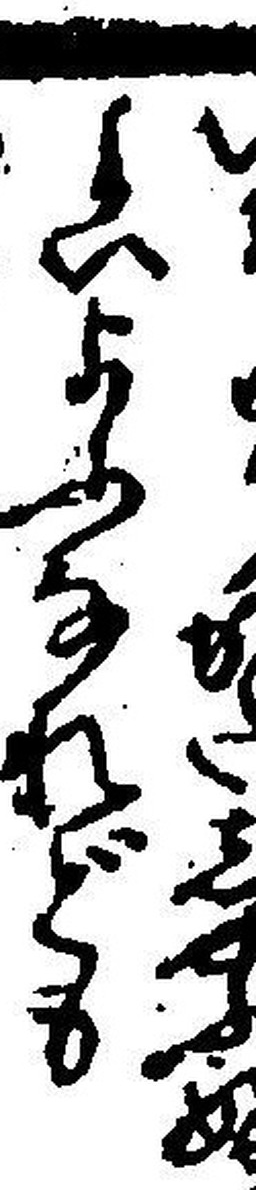よいよふなれども
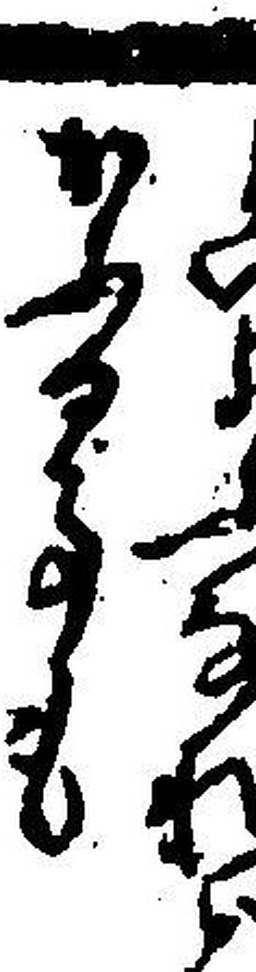かふる事も
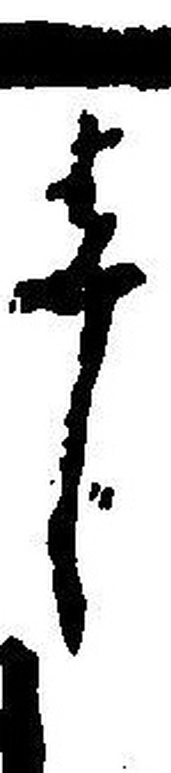はやし
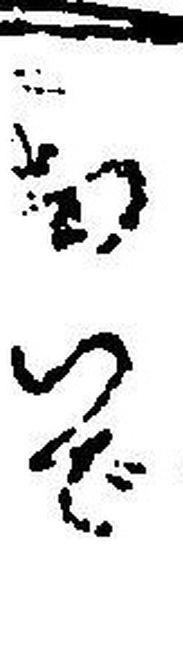おいで
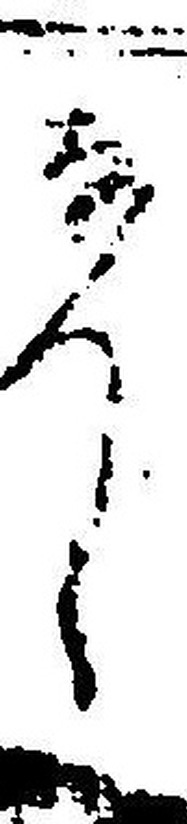なんし
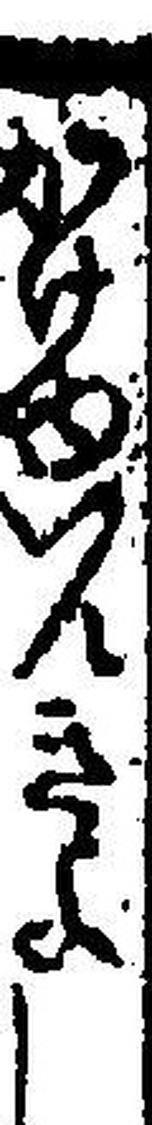かけゆいんきよ
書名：御代参牛時詣 / 市場通笑作
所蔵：東京大学総合図書館 General Library in the University of Tokyo, JAPAN
